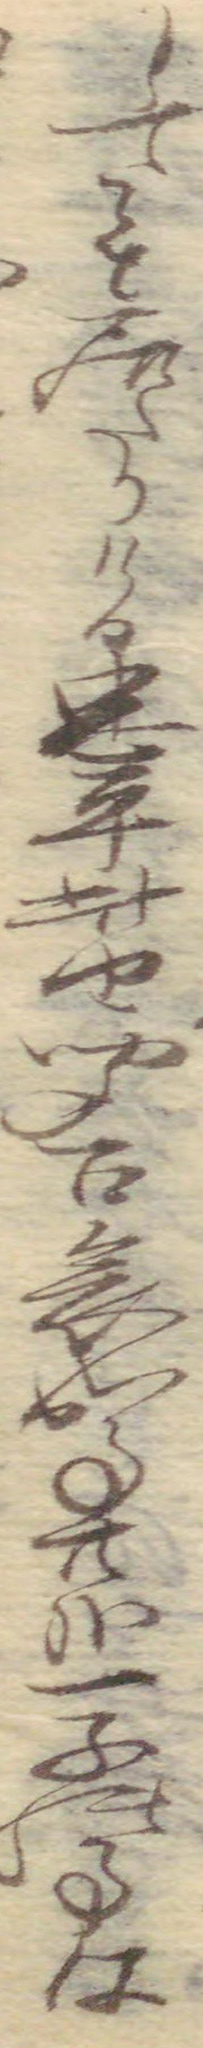してこそ居たりける忠平此由聞召哀成事共哉一子の事は
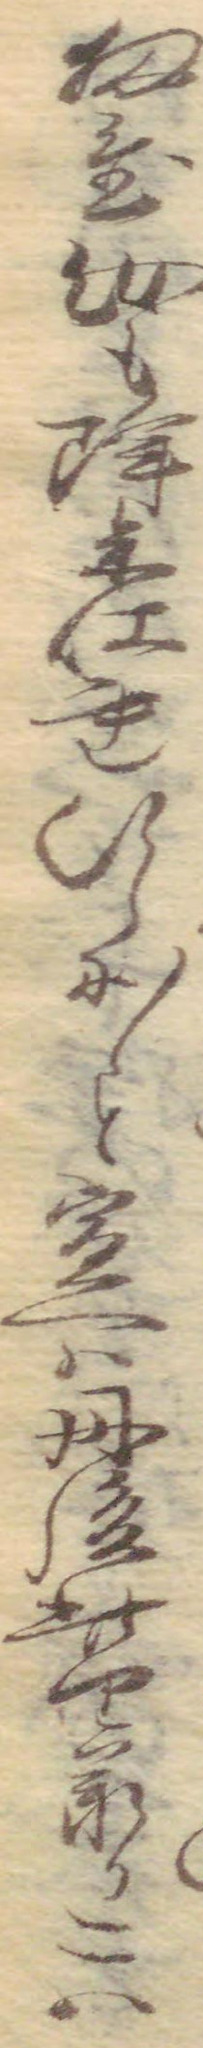扨置汝も降参仕れひらに〳〵と宣へは丹後此由承りこは

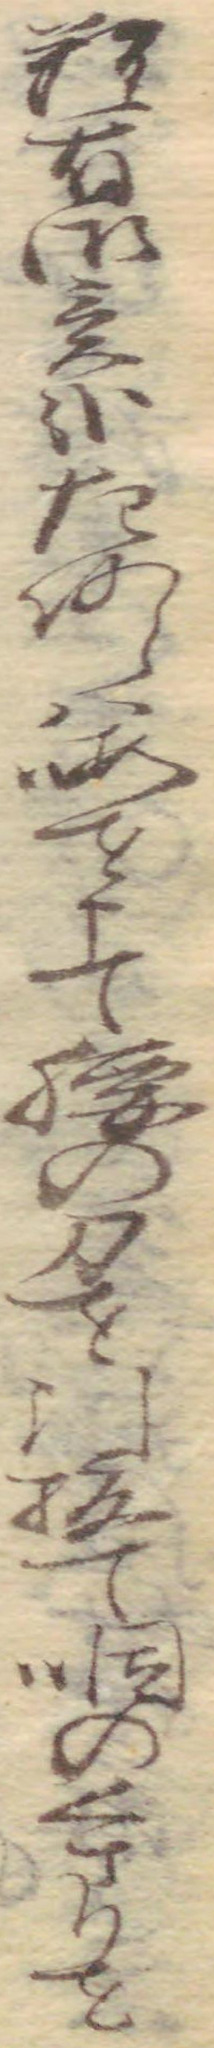難有御意哉左あらは暇を申して腰の刀を引抜て咽のくさりを
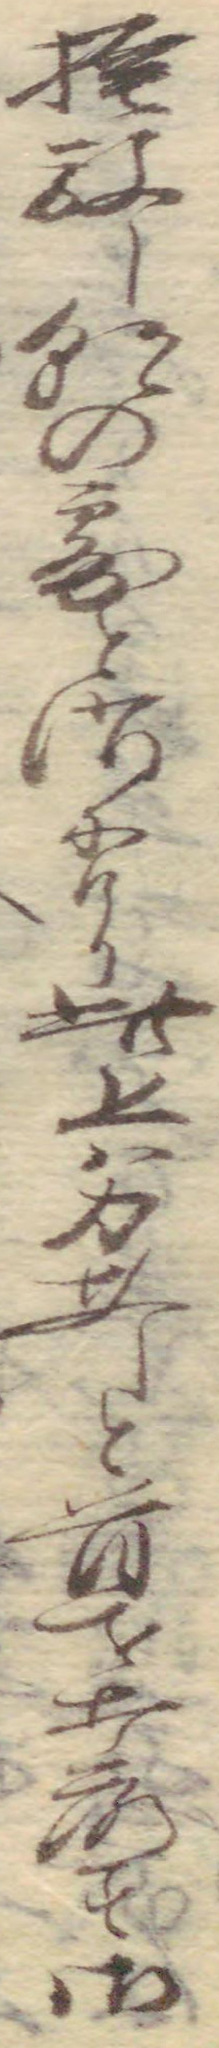掻放し朝の露と消にけり此上は力なしと首を打落す御
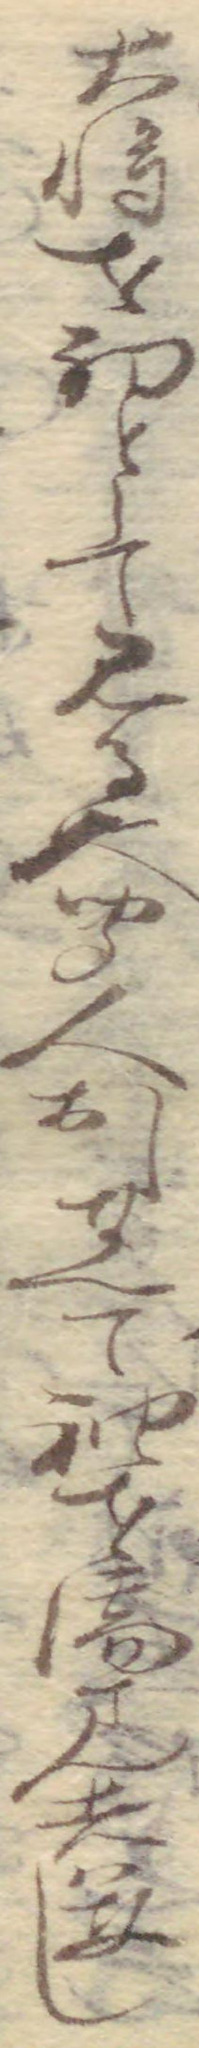大将を初として見る人聞人おしなへて袖を濡さん者はなし
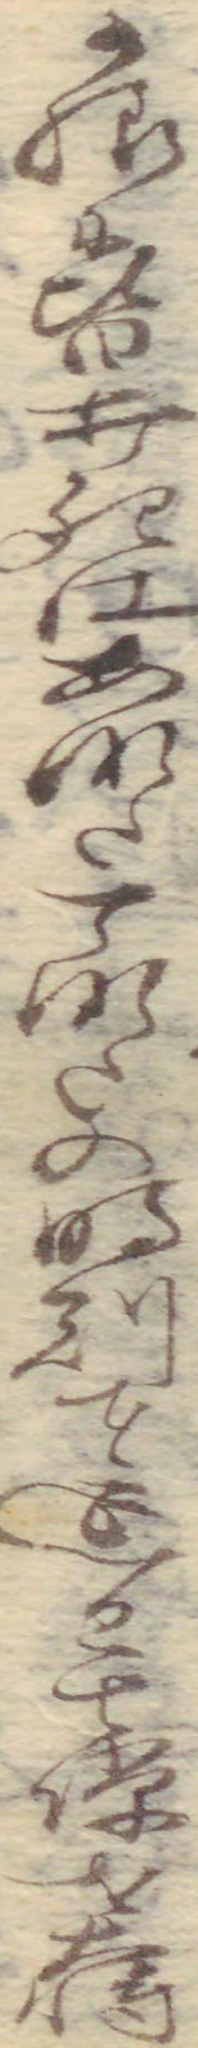か様に皆打死仕あなたこなたの時刻を延る其隙を大将
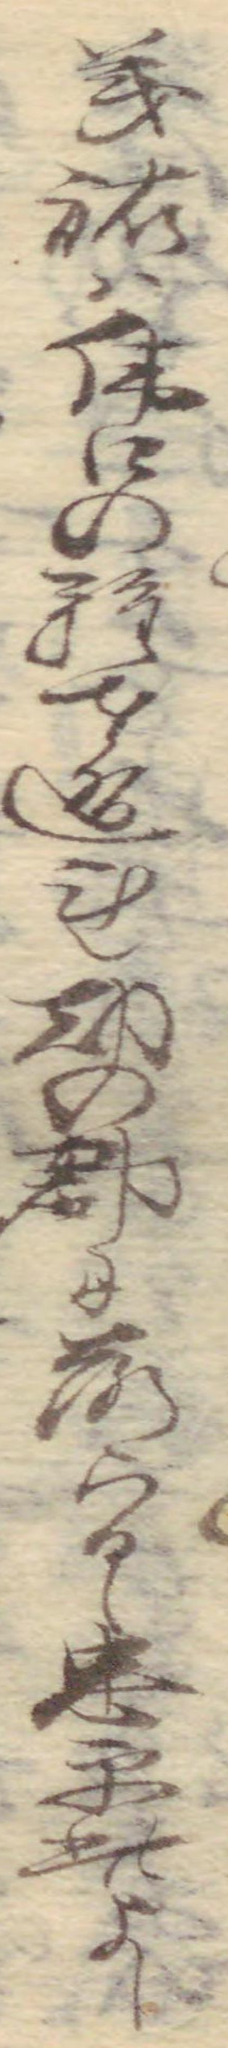義祐は乕口の難を遁れ都の郡に落らるゝ忠平此よし
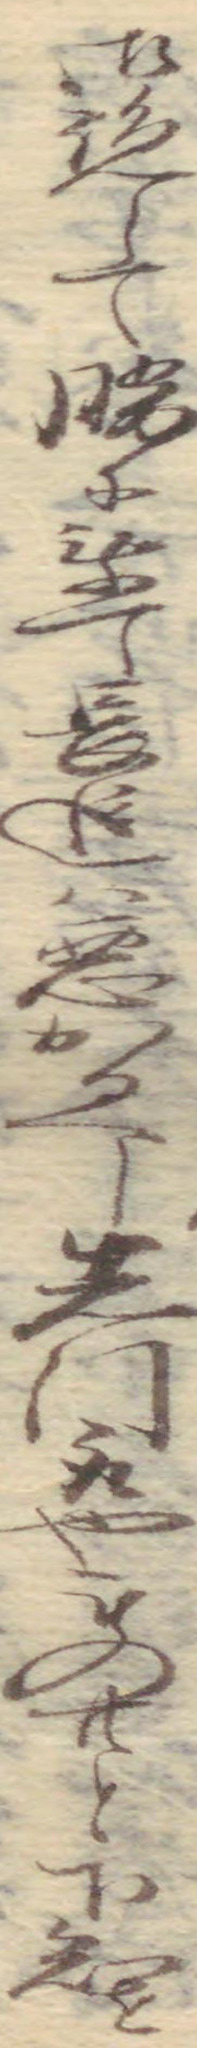御覧して勝に乗て長追は悪かるへし先引取やもの共と下知を
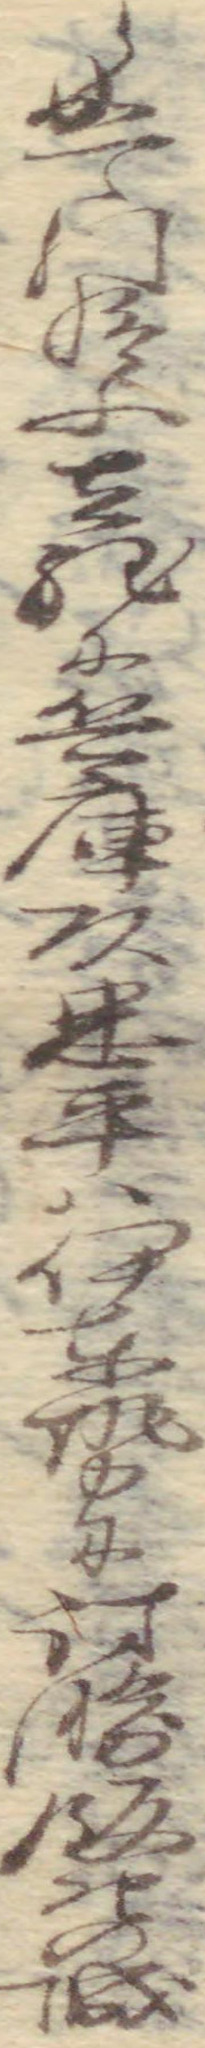し成て引給ふ去程に兵庫頭忠平は伊東勢に討勝飯野の城
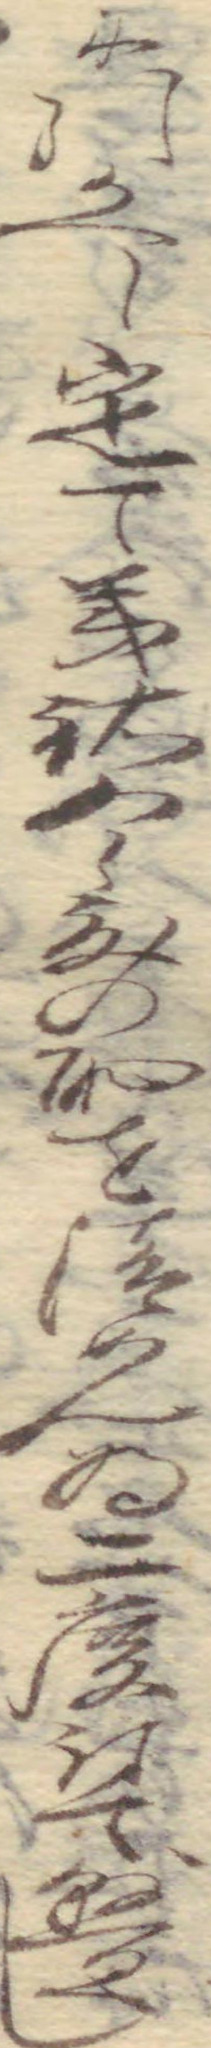に引かへし定て義祐今度の恥を清めん為二度討て懸るへし
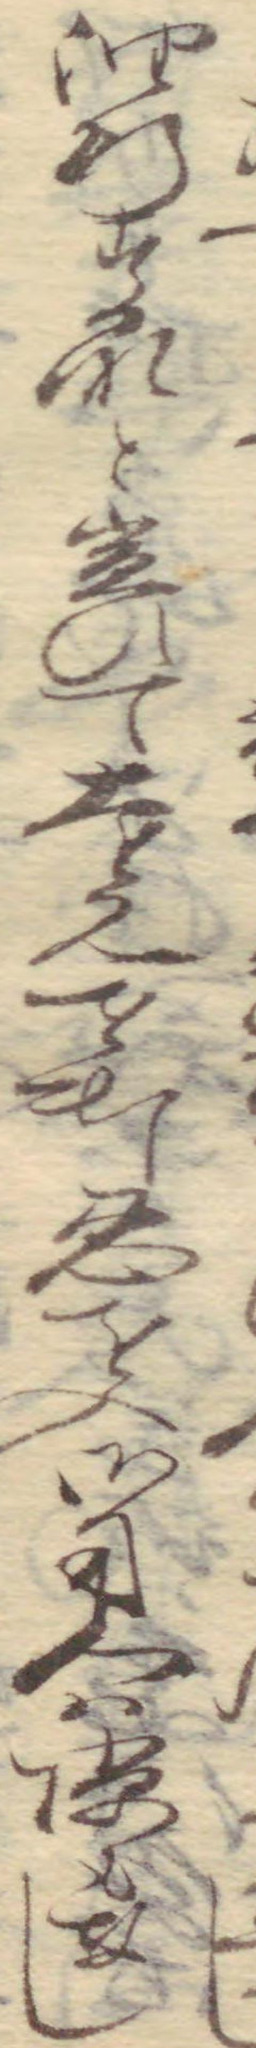油断するなと宣ひて遠見を出し忍を入御用心は隙もなし
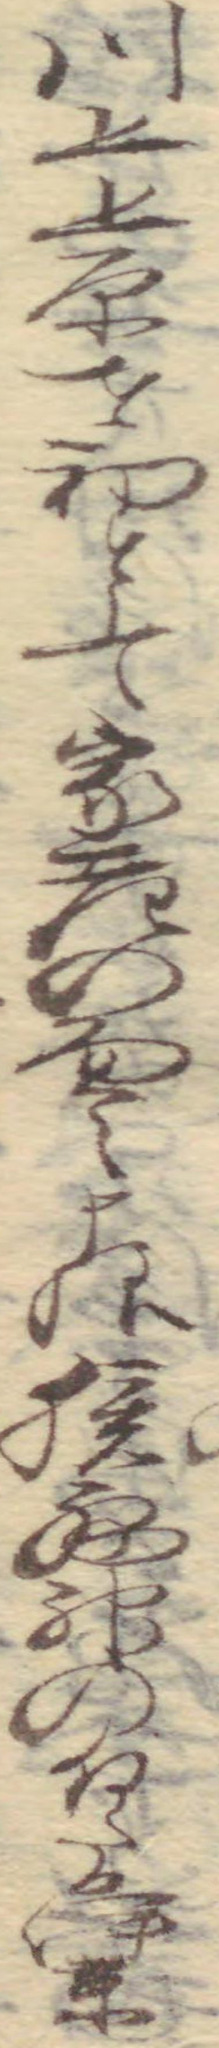川上上原を初として家老の面々申様臆病神の付たる伊東
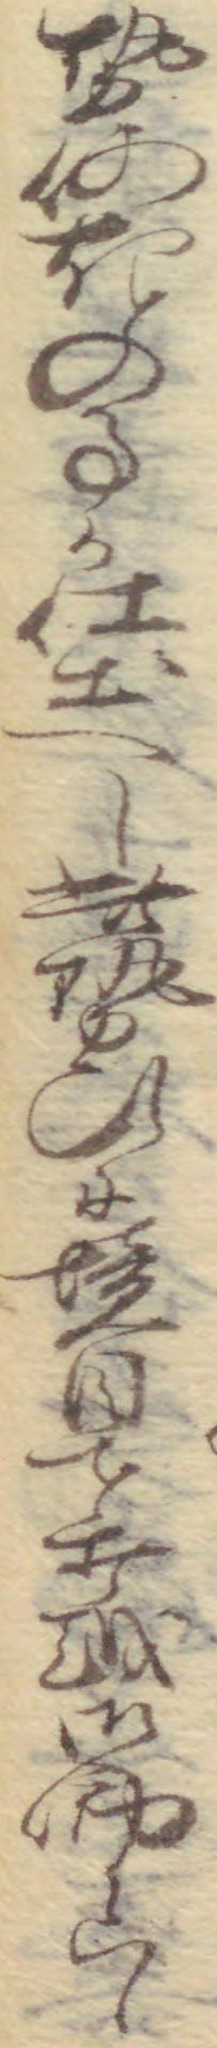勢何ほとの事か仕出へし此勢ひに境目を打越御働候はゝ
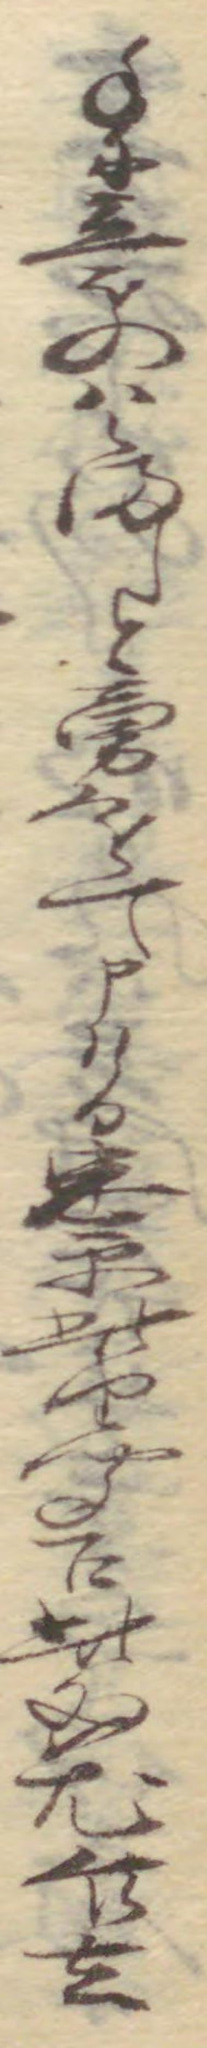手に立ものは候ましと勇進て申ける忠平此由聞召此義尤乍去
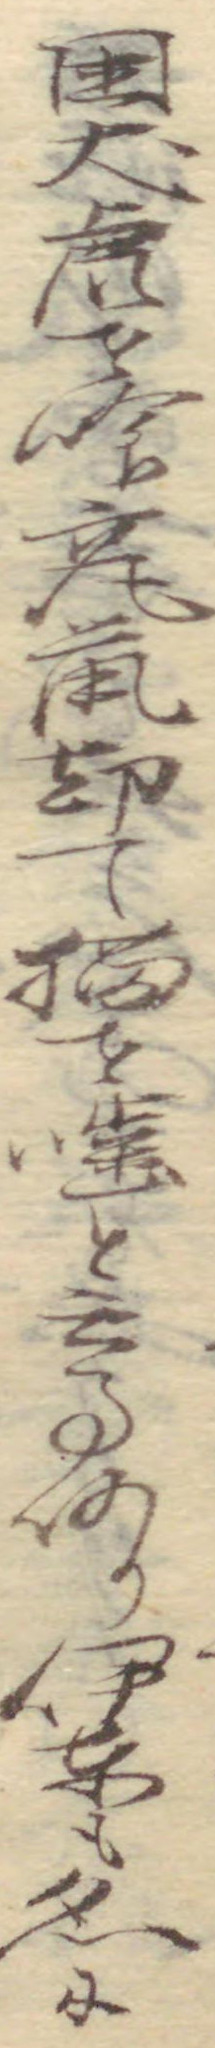困犬虎を喰究鼠却て猫を嚙と云事あり伊東も名に
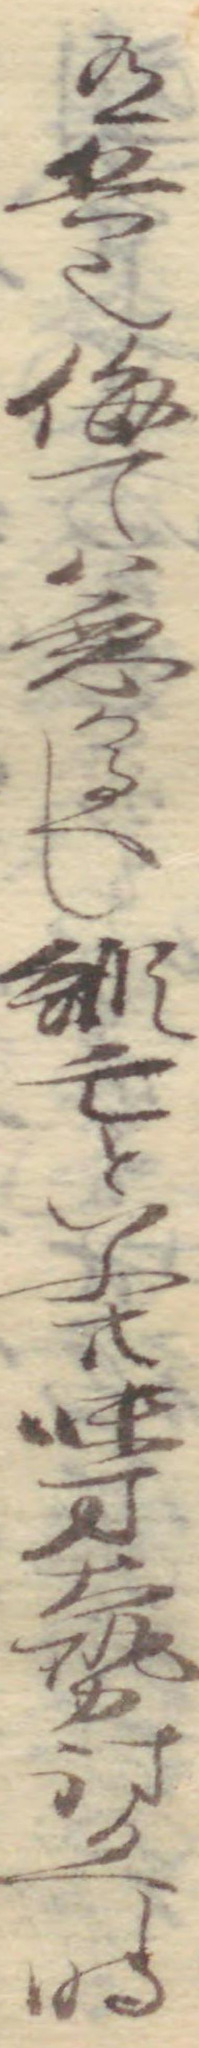有兵也侮ては悪かるへし縦亡といふ共味方大勢討るへし時
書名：鶯宿雑記. 巻199-200
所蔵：国立国会図書館 National Diet Library, JAPAN
